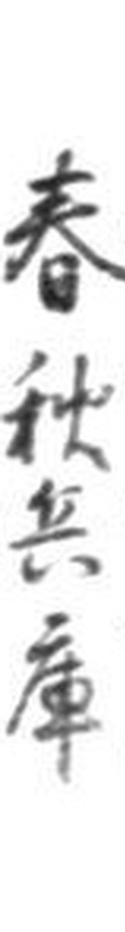春秋兵庫
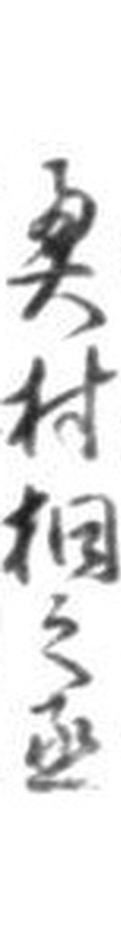奥村桐之丞
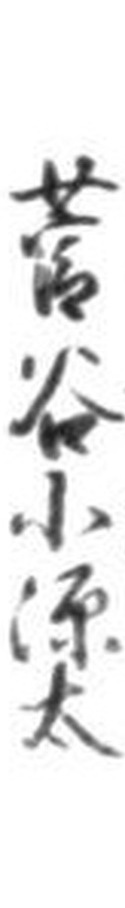菅谷小源太

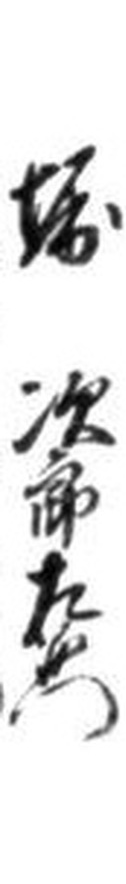堀次郎左衛門
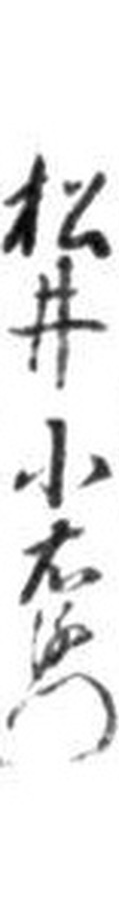松井小右衛門
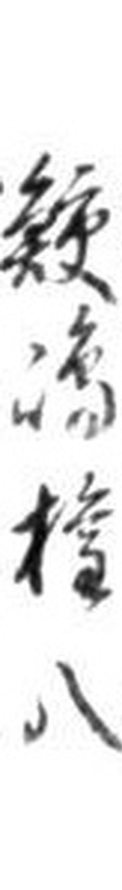鮫嶋権八
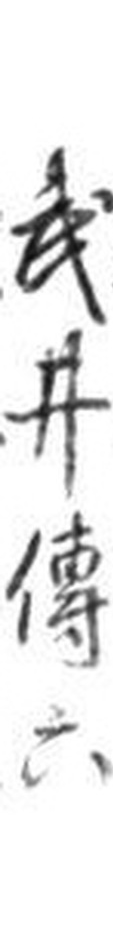武井伝六
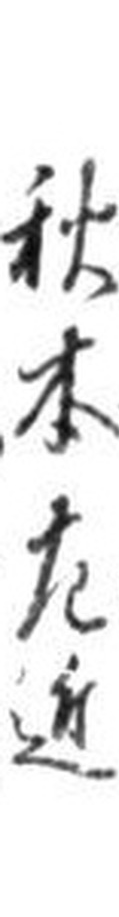秋本左近
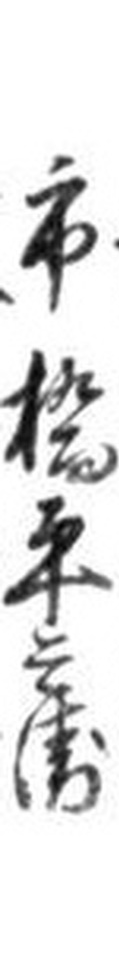市橋平兵衛
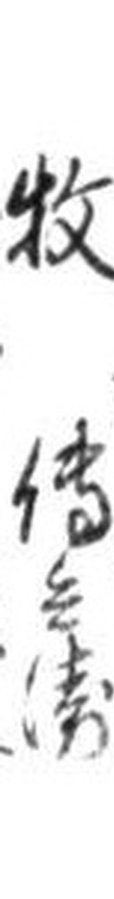牧伝兵衛
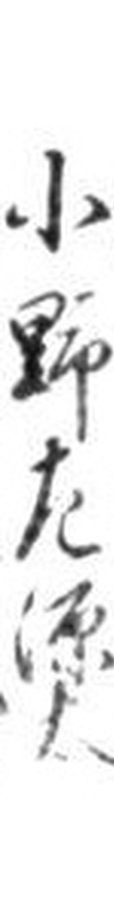小野左源太
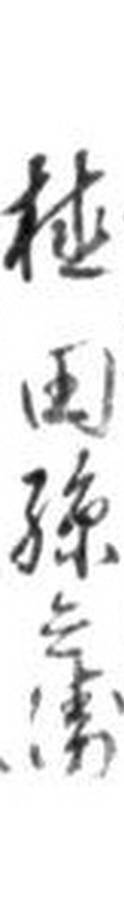植田孫兵衛
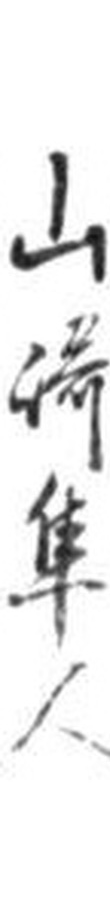山崎隼人
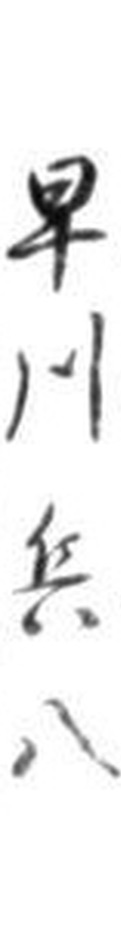早川兵八
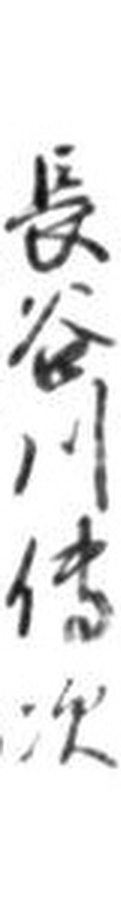長谷川伝次
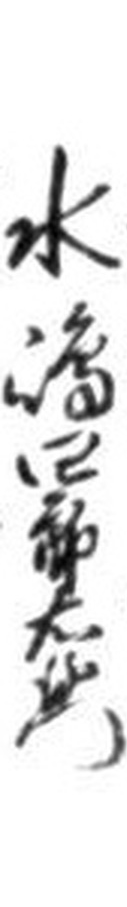水嶋四郎右衛門
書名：家譜 二 忠直公 従文禄四年到慶安四年
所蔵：福井県文書館 Fukui Prefectural Archives
